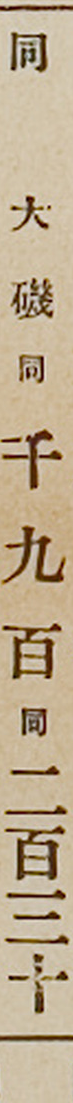同大磯同千九百同二百三十
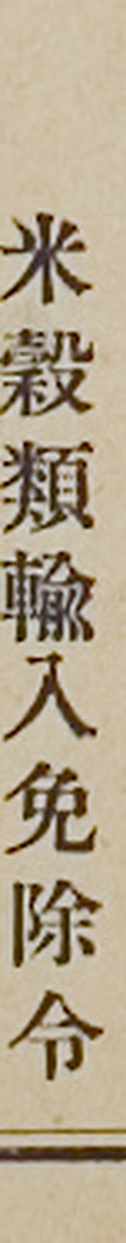同米穀類輸入免除令
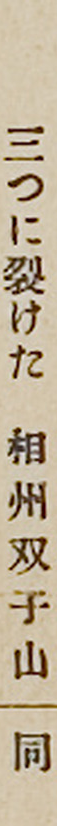同三つに裂けた相州双子山
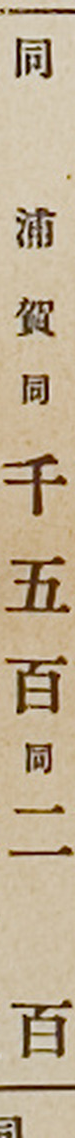同浦賀同千五百同二百
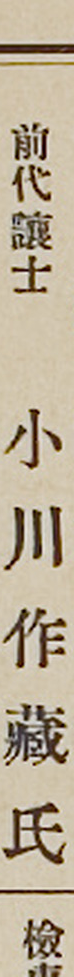前代議士小川作蔵氏
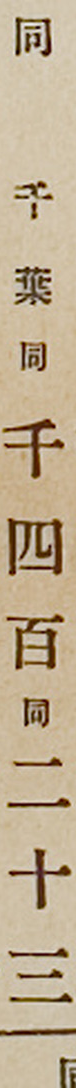同千葉同千四百同二十三
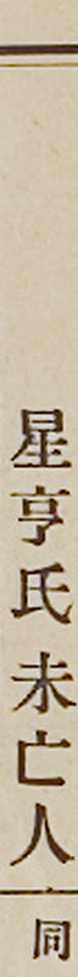星亨未亡人
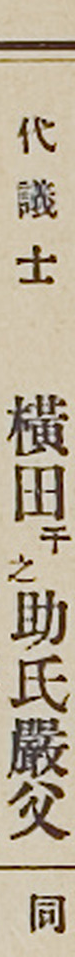代議士横田千之助氏厳父
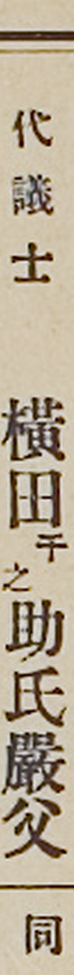代議士横田千之助氏厳父
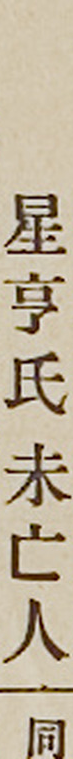星亨未亡人
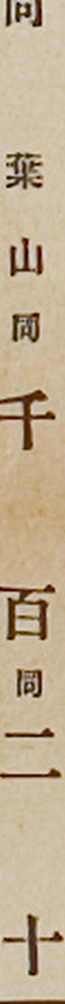同葉山同千百同二十
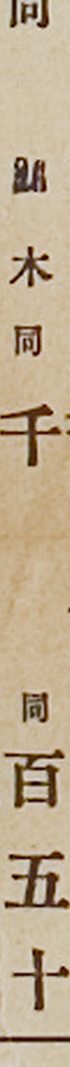同木同千同百五十
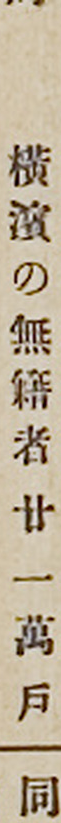同横浜の無籍者廿一万戸
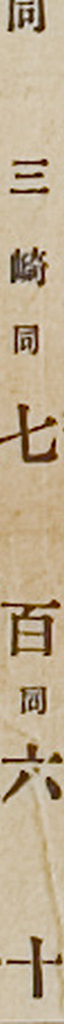同三崎同七百同六十
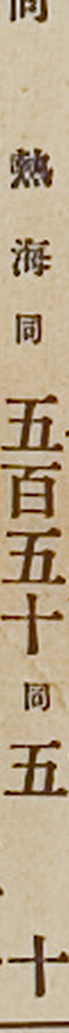同熱海同五百五十同五十
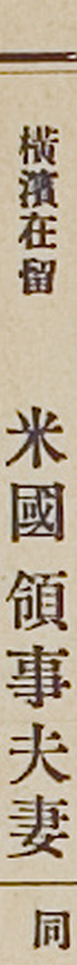横浜在留米国領事夫妻
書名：関東大震災大見立一覧表
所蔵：東京大学総合図書館 General Library in the University of Tokyo, JAPAN
